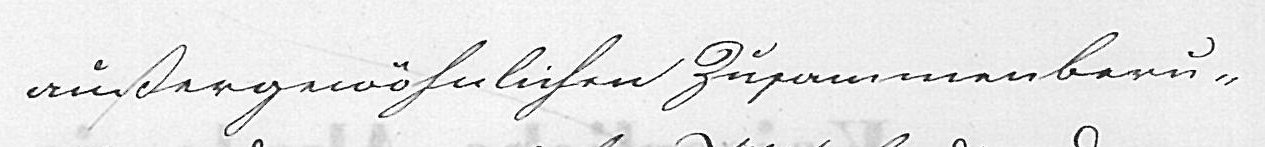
außergewöhlichen Zusammenberu-
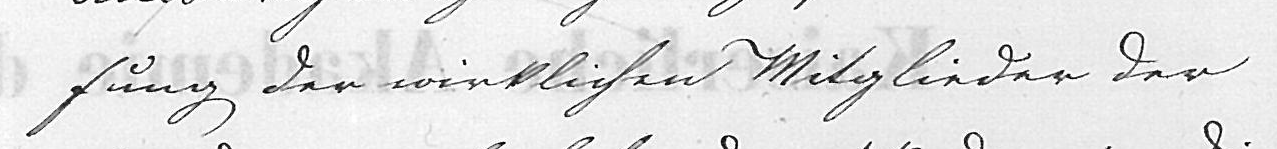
fung der wirklichen Mitglieder der
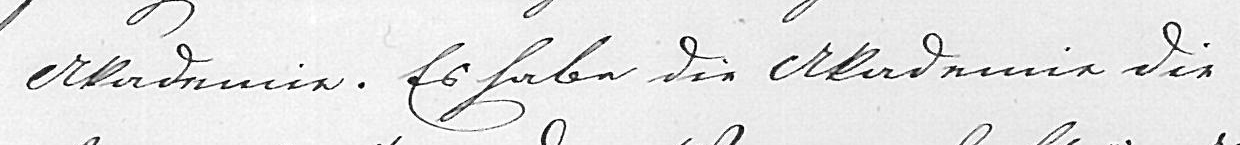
Akademie. Es habe die Akademie die
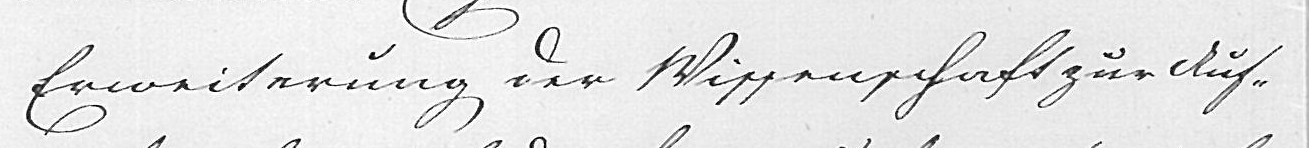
Erweiterung der Wissenschaft zur Auf-
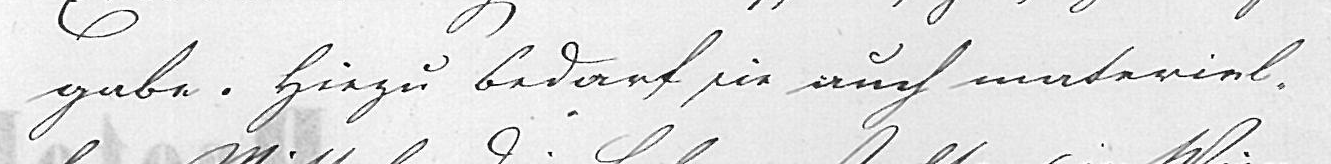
gabe. Hiezu bedarf sie auch materiel-
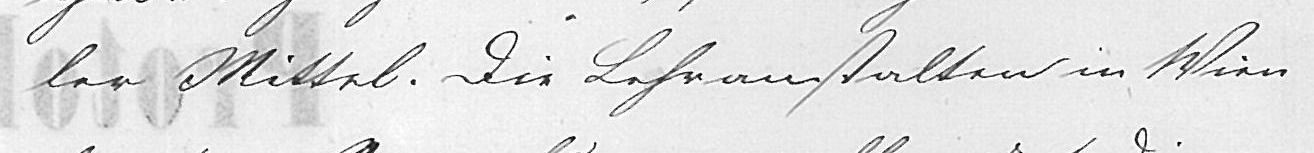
ler Mittel. Die Lehranstalten in Wien
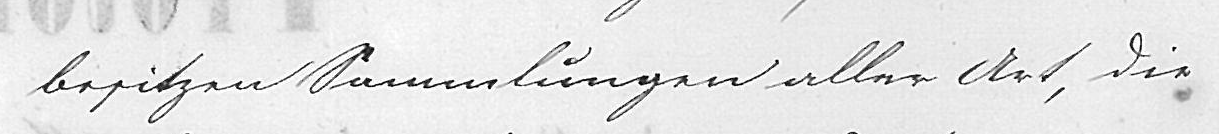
besitzen Sammlungen aller Art, die
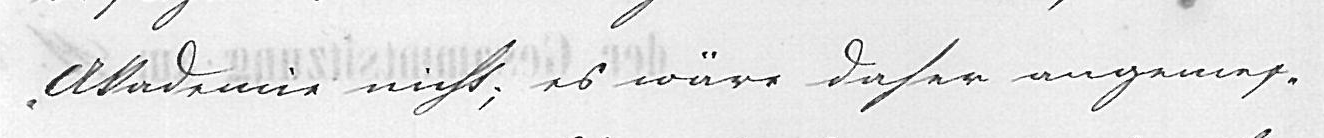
Akademie nicht; es wäre daher angemes-
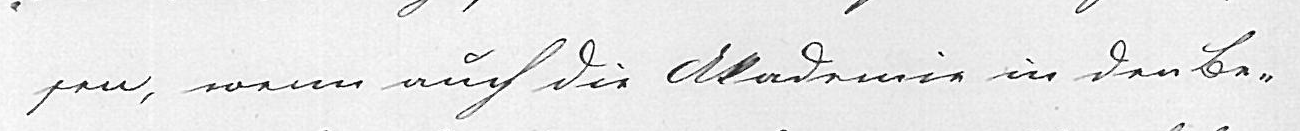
sen, wenn auch die Akademie in den Be-
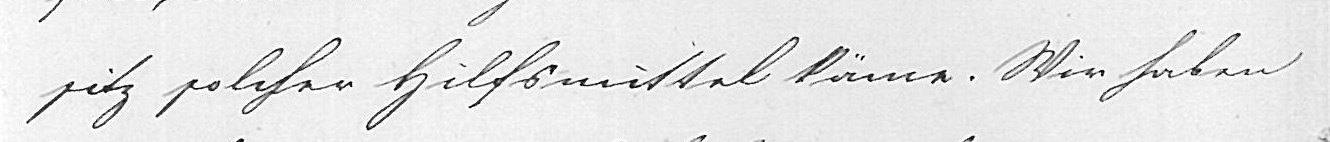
sitz solcher Hilfsmittel käme. Wir haben
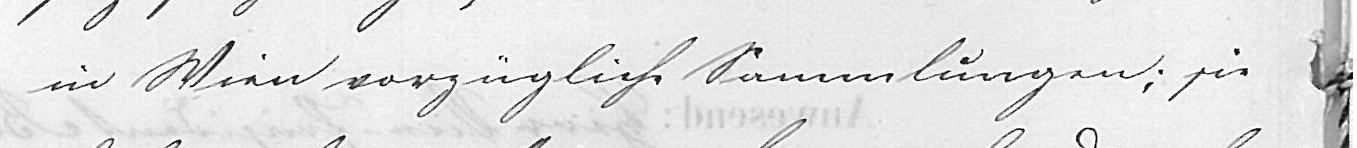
in Wien vorzügliche Sammlungen; sie
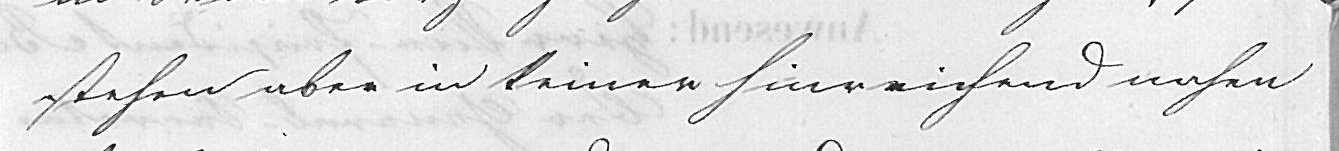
stehen aber in keiner hinreichend nahen
